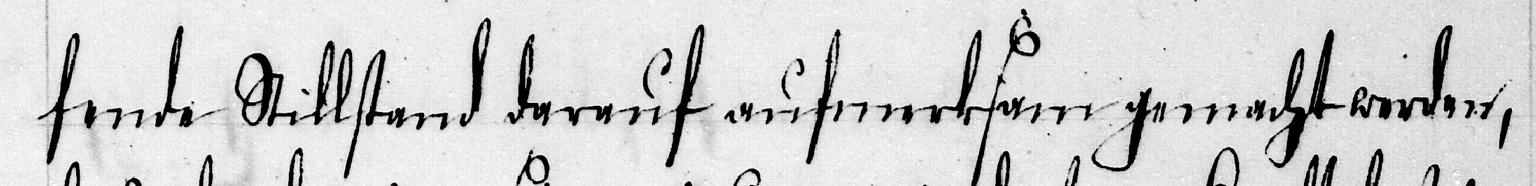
fende Stillstand darauf aufmerksam gemacht werden,
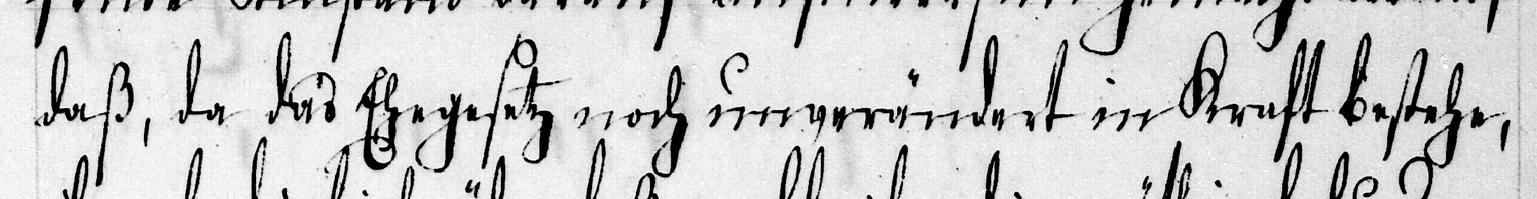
daß, da das Ehegesetz noch unverändert in Kraft bestehe,
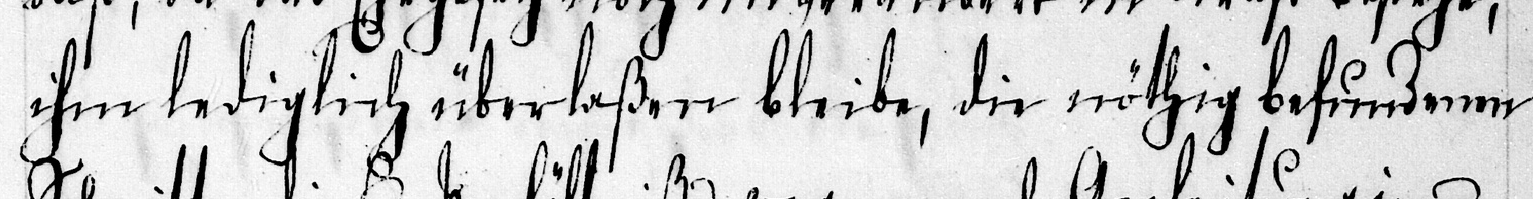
ihm lediglich überlaßen bleibe, die nöthig befundenen
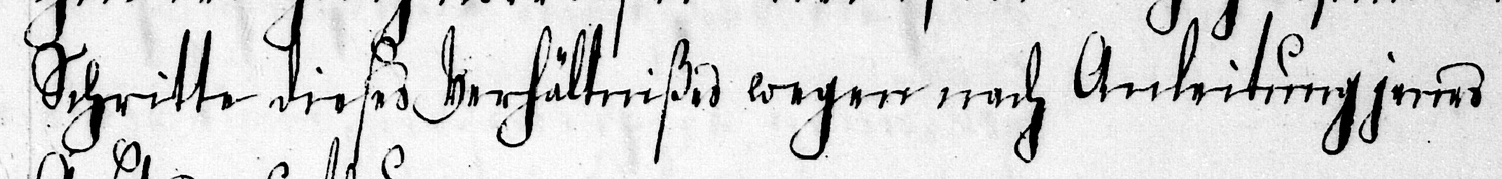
Schritte dieses Verhältnißes wegen nach Anleitung jenes
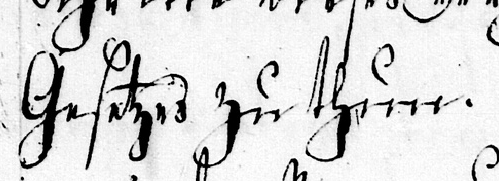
Gesetzes zu thun.
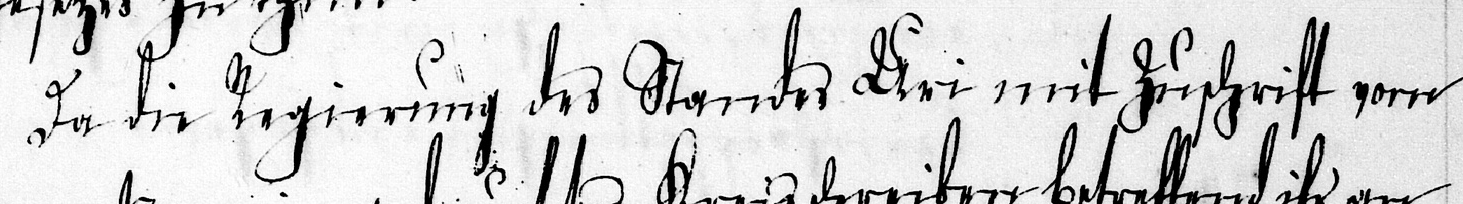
Da die Regierung des Standes Uri mit Zuschrift vom
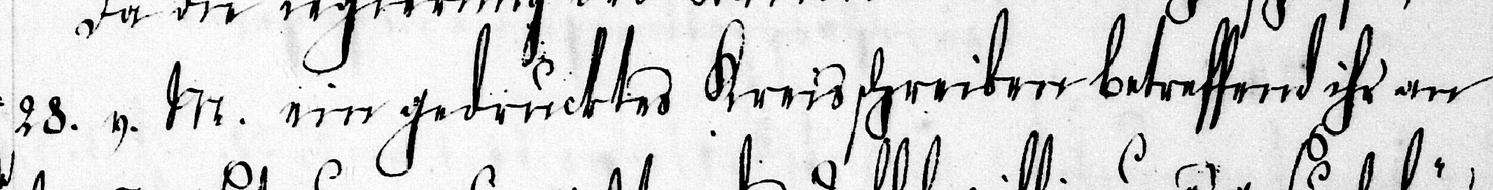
28. v. M. ein gedrucktes Kreisschreiben betreffend ihr an
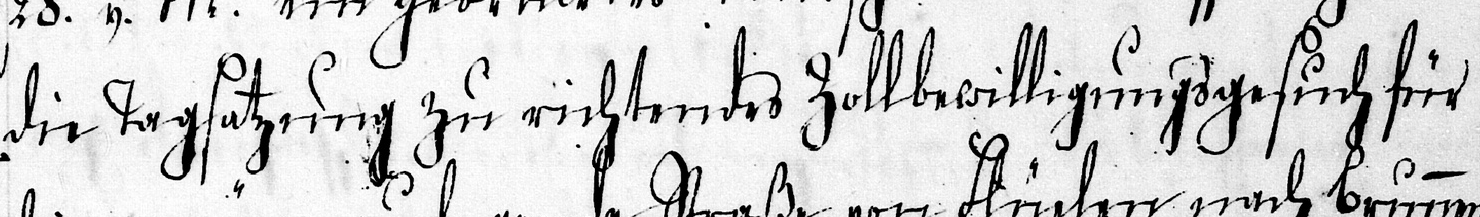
die Tagsatzung zu richtendes Zollbewilligungsgesuch für
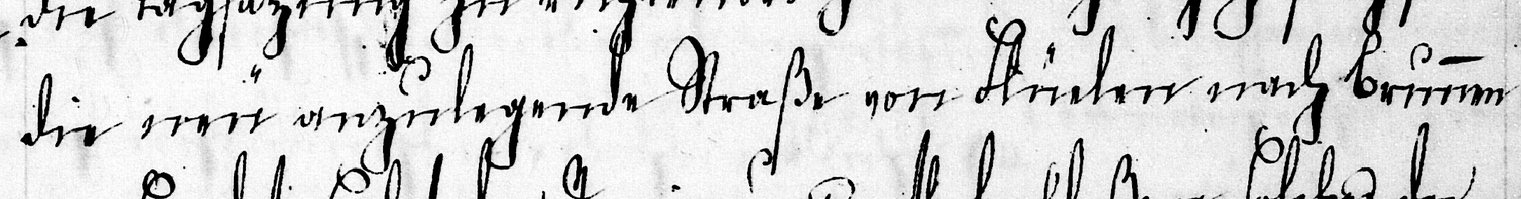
die neu anzulegende Straße von Flüelen nach Brunnen
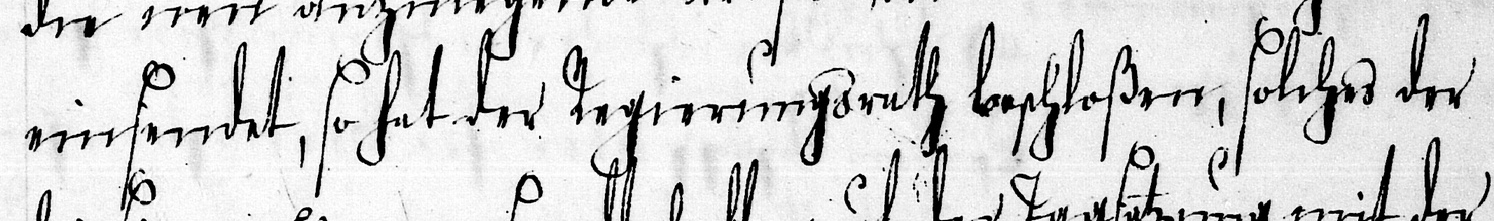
einsendet, so hat der Regierungsrath beschloßen, solches der
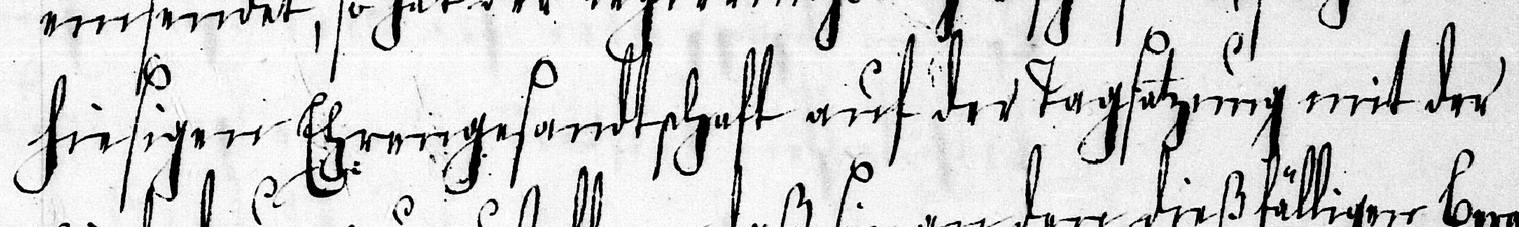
hiesigen Ehrengesandtschaft auf der Tagsatzung mit der
